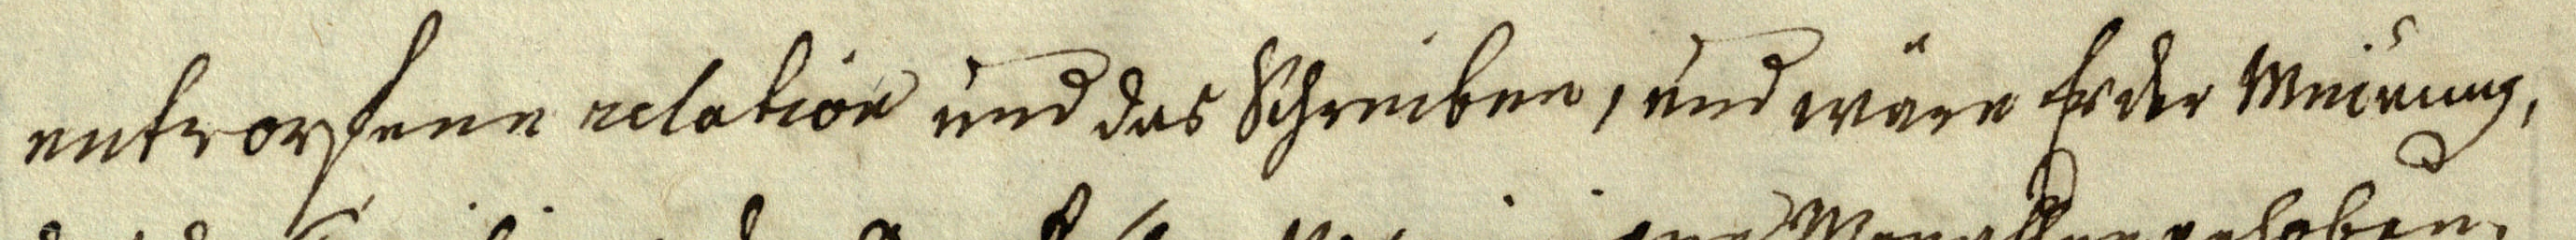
entworfene relation und das Schreiben, und wäre Er der Meinung,
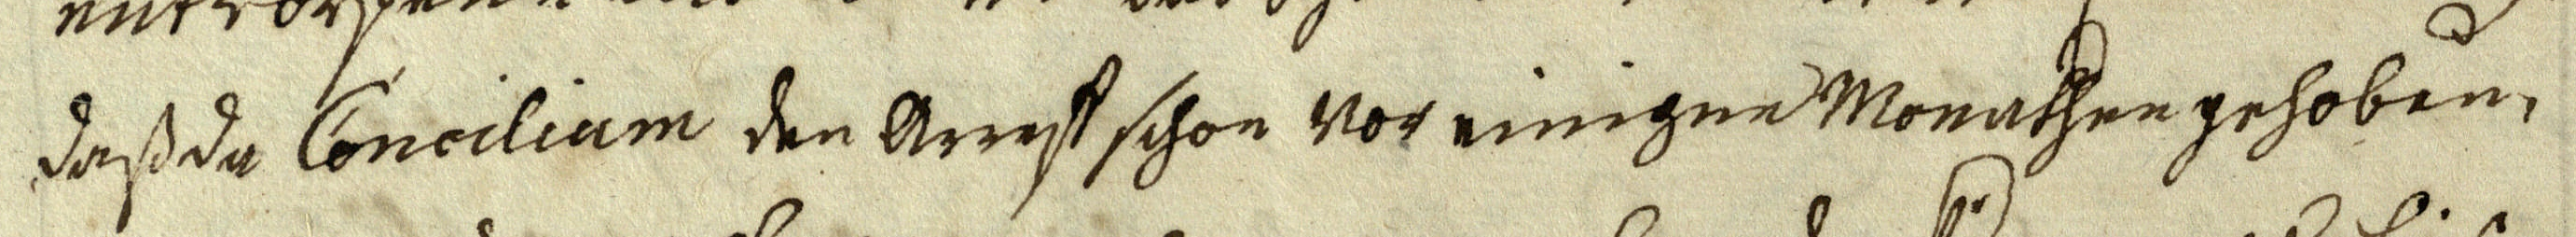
daß da Concilium den Arrest schon vor einigen Monathen gehoben,
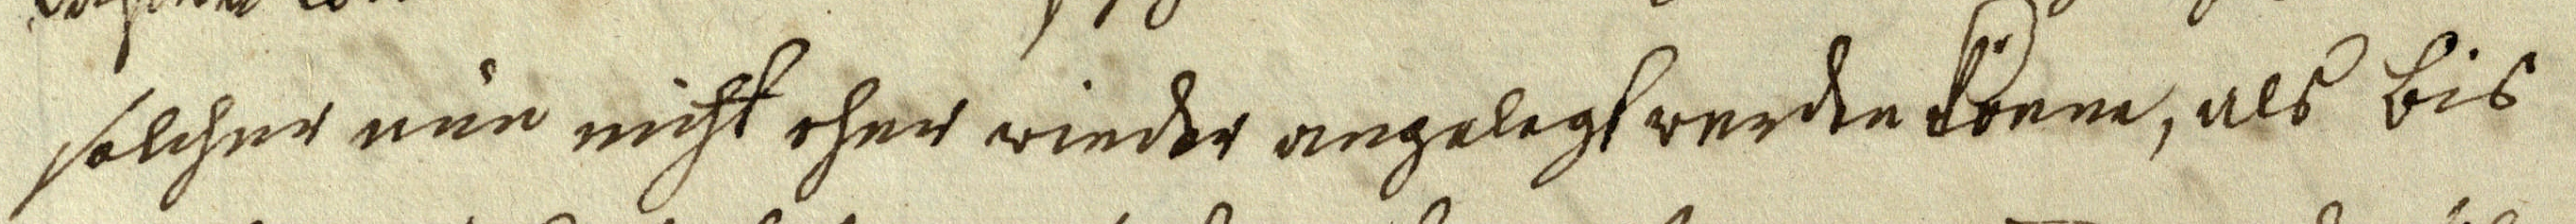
solcher nun nicht eher wieder angelegt werden könne, als bis
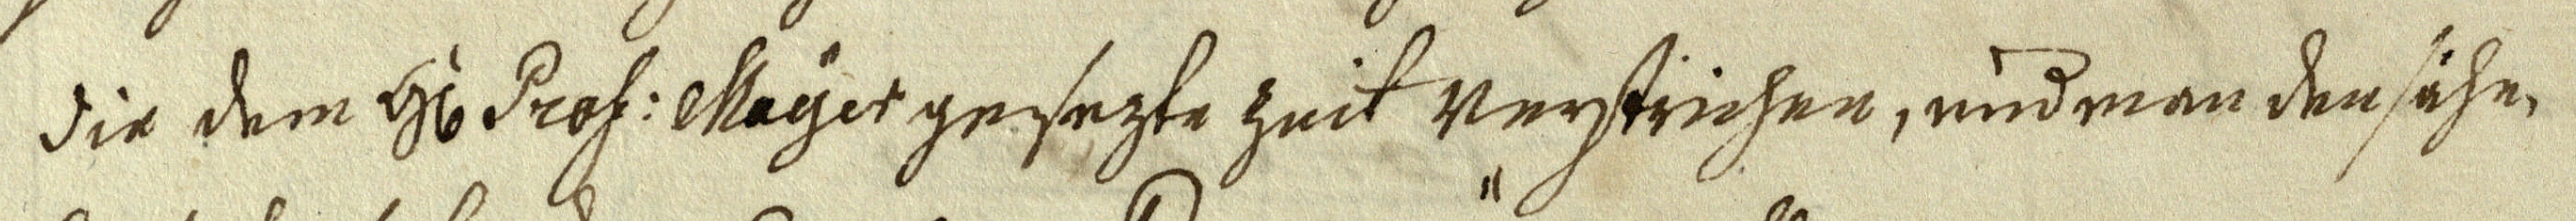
die dem H. Prof. Maÿer gesezte Zeit verstrichen, und man den sähe,
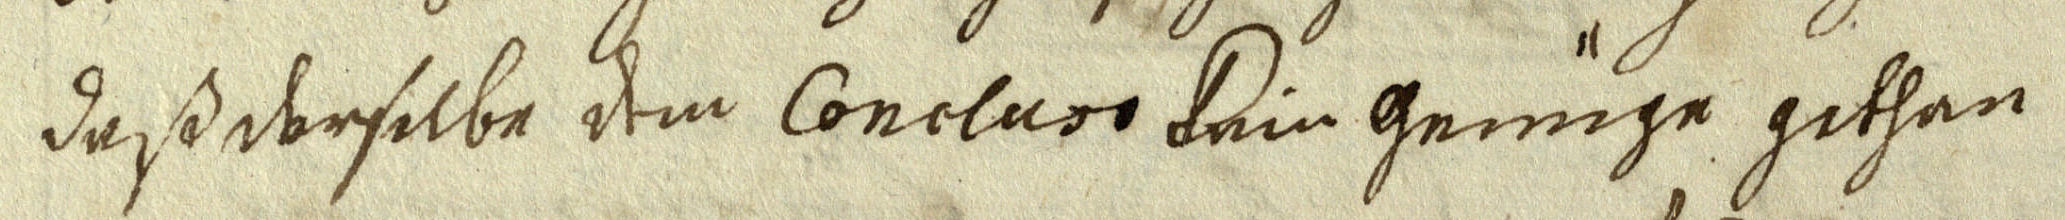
daß derselbe dem Concluso kein Genüge gethan.
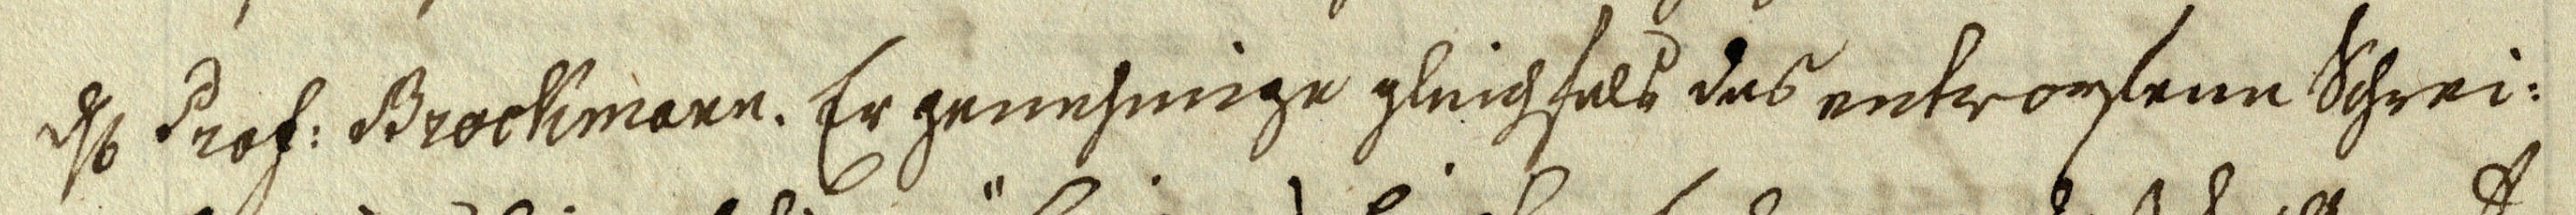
dh Prof. Brockmann. Er genehmige gleichfals das entworfene Schrei¬
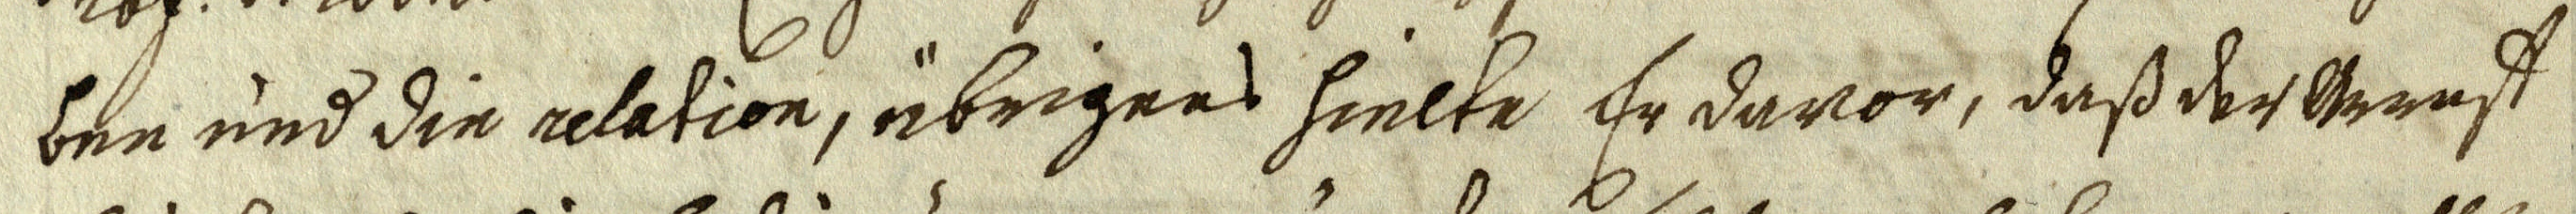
ben und die relation, übrigens hielte Er davor, daß der Arrest
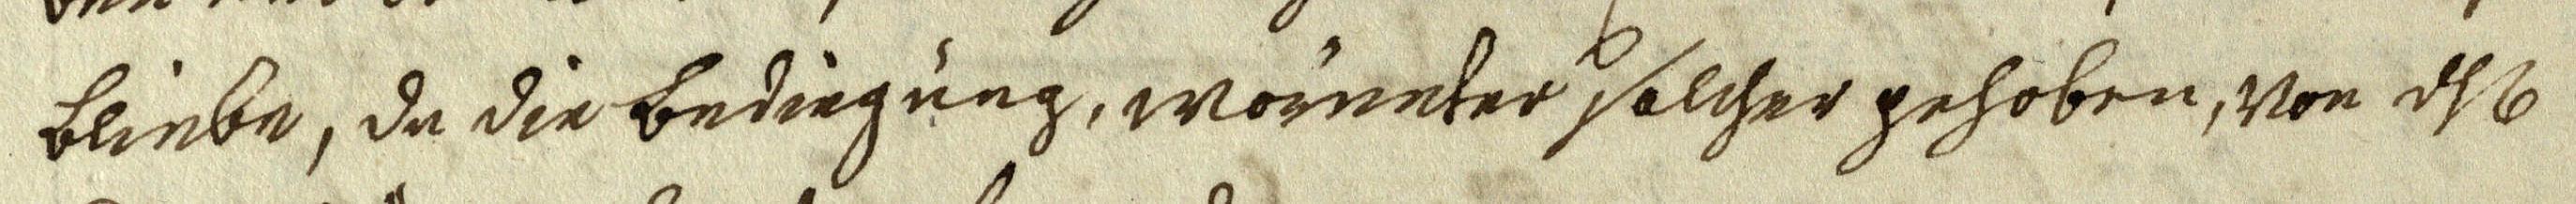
bliebe, da die Bedingung, worunter solcher gehoben, von dh
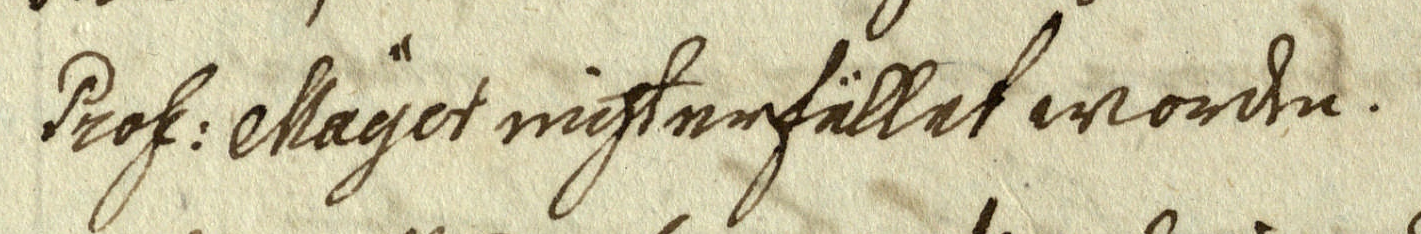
Prof. Maÿer nicht erfüllet worden.
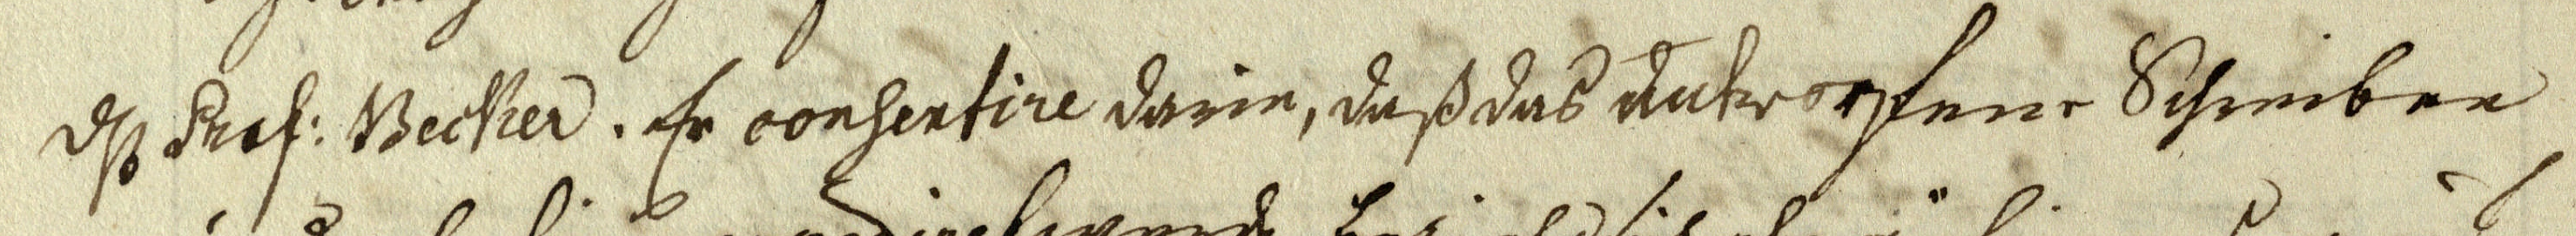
dh Prof. Becker. Er consentire darin, daß das entworfene Schreiben
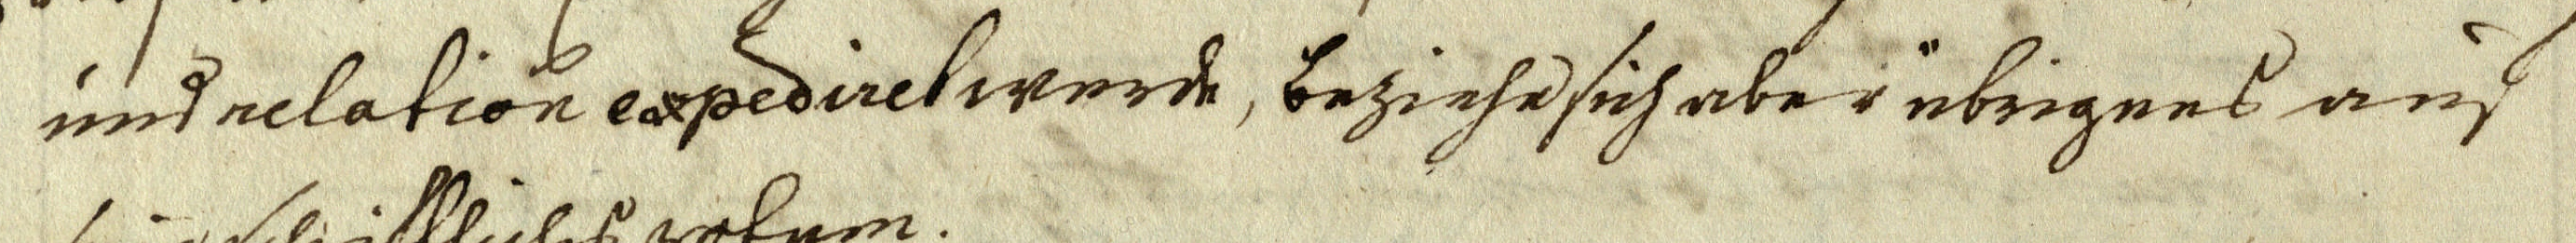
und relation expediret werde, beziehe sich aber übrigens auf
